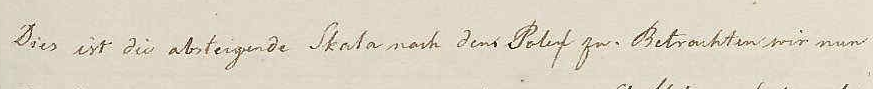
Dies ist die absteigende Skala nach denm Polen zu. Betrachten wir nun
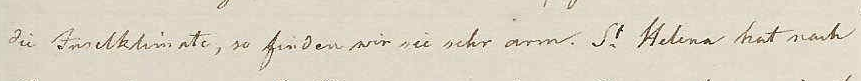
die Inselklimate, so finden wir sie sehr arm. St Helena hat nach
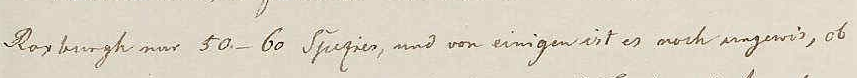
Roxburgh nur 50–60 Spezies, und von einigen ist es noch ungewis, ob
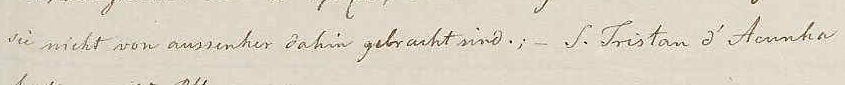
sie nicht von dahin gebracht sind.; – S. Tristan d'Acunha
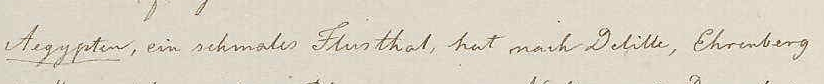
Aegypten, ein schmales Flusthal, hat nach Delille, Ehrenberg
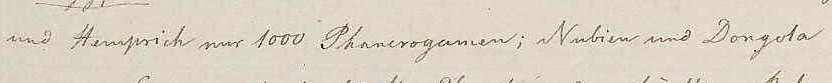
und Hemprich nur 1000 Phanerogamen; Nubien und Dongola
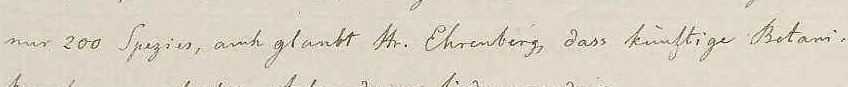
nur 200 Spezies, auch glaubt Hr. Ehrenberg, dass künftige Botani-
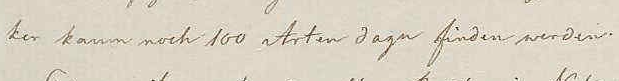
ker kaum noch 100 Arten dazu finden werden.
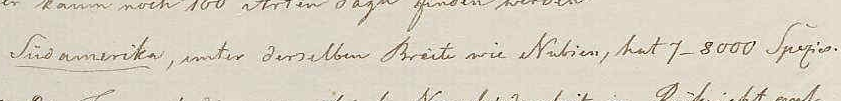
Südamerika, unter derselben Breite wie Nubien, hat 7–8000 Spezies.
